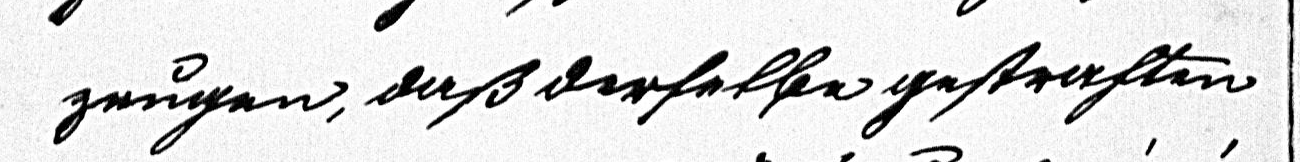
zeugen, daß derselbe gestraften
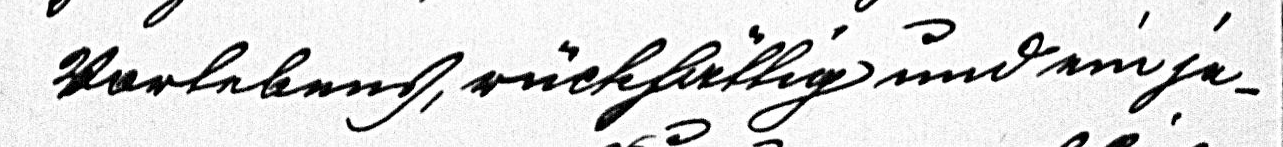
Vorlebens, rückhättig und ein je¬
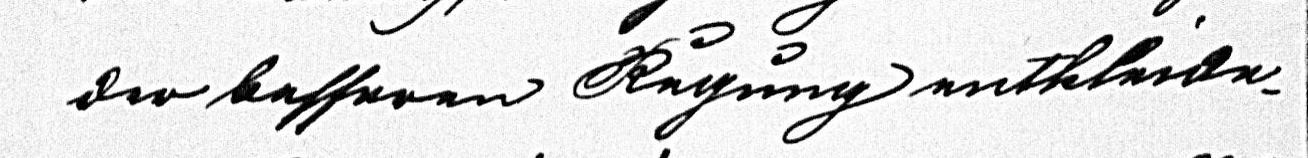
der besseren Regung entkleide¬
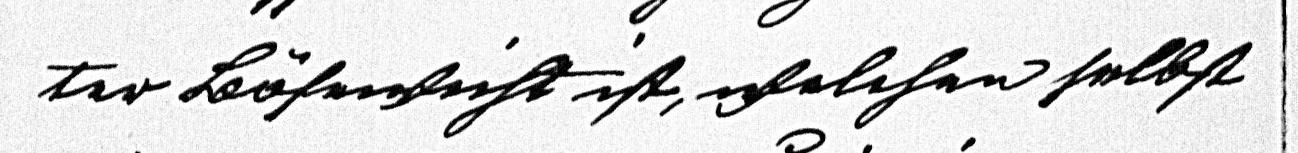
ter Bösewicht ist, welchen selbst
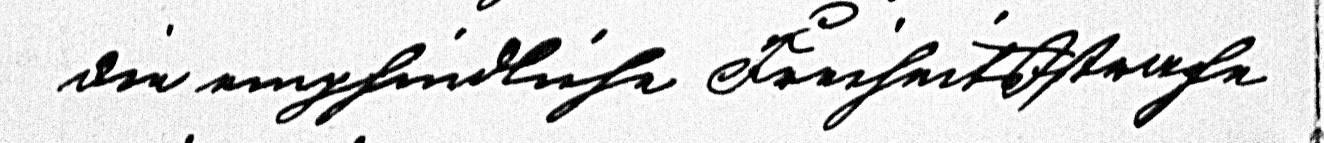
die empfindliche Freiheitsstrafe
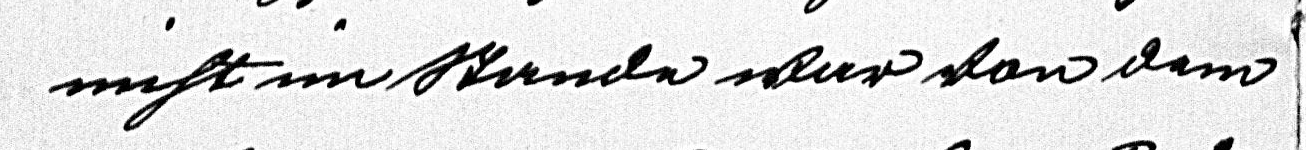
nicht im Stande war von dem
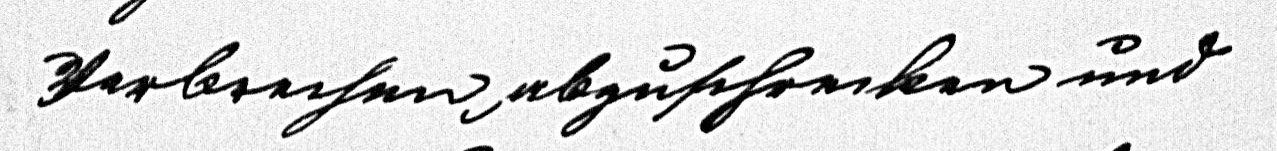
Verbrechen abzuschrecken und
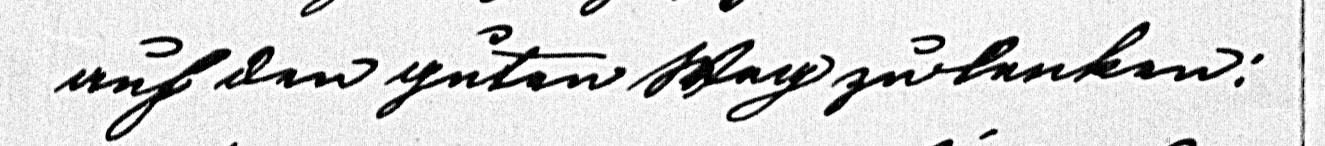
auf den guten Wag zulenken:
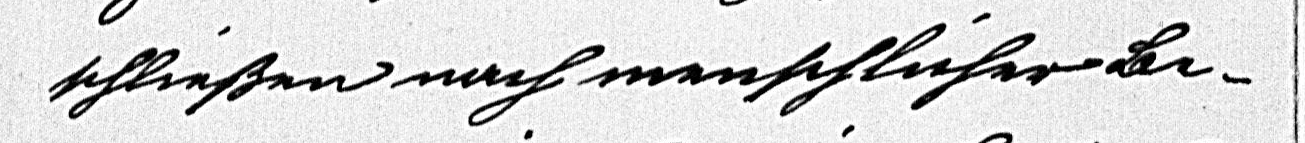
schließen nach menschlicher Be¬
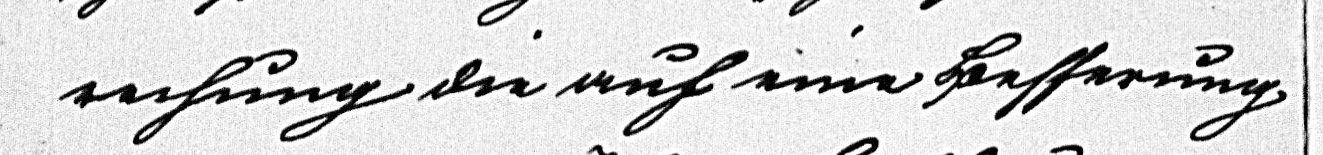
rechung die auf eine Besserung
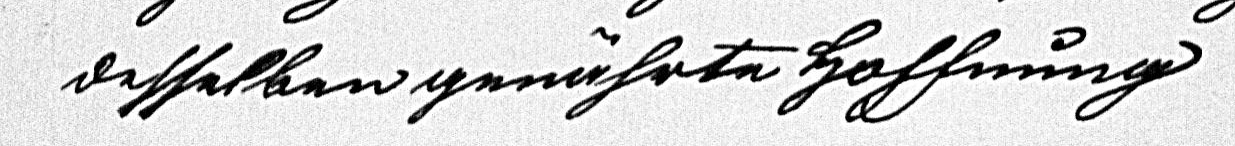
desselben genährte Hoffnung
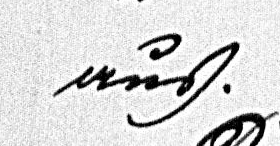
aus.
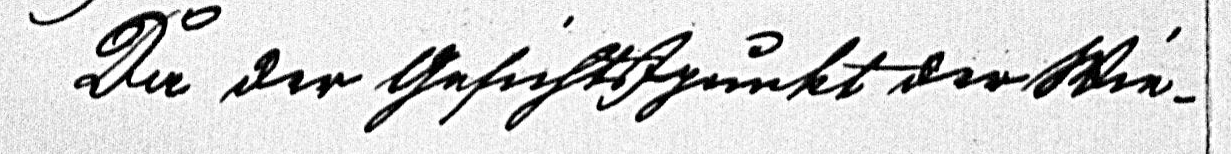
Da der Gesichtspunkt der Wie¬
